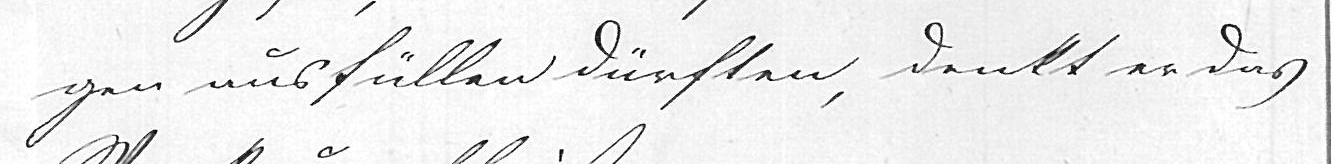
gen ausfüllen dürften, denkt er das
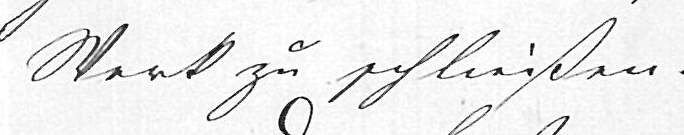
Werk zu schließen.
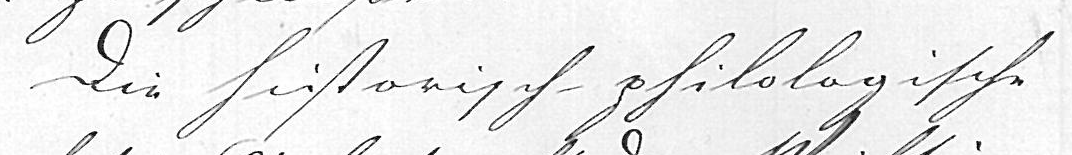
Die historisch-philologische
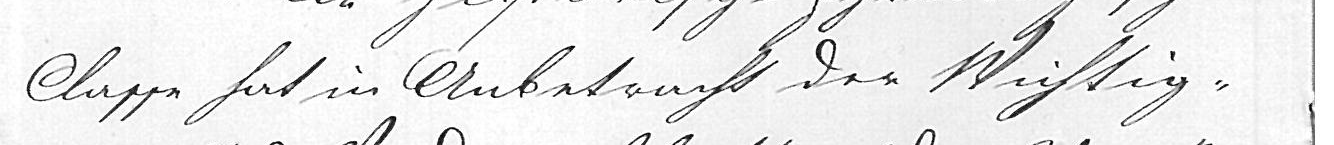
Classe hat in Anbetracht der Wichtig-
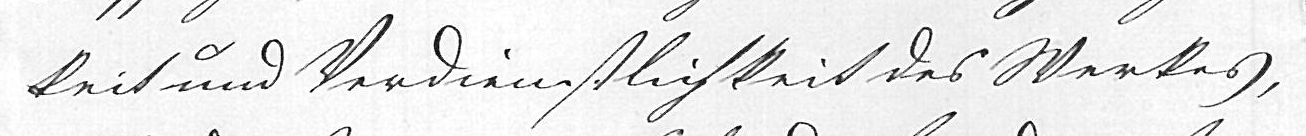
keit und Verdienstlichkeit des Werkes,
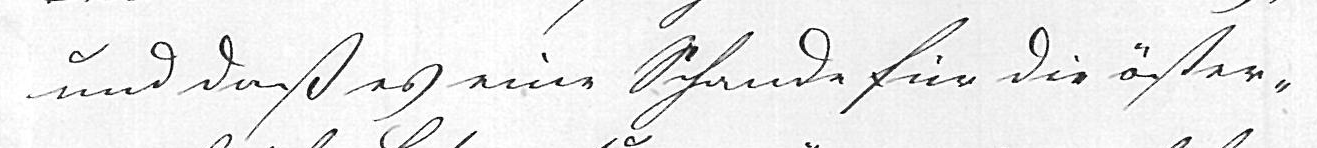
und daß es eine Schande für die öster-
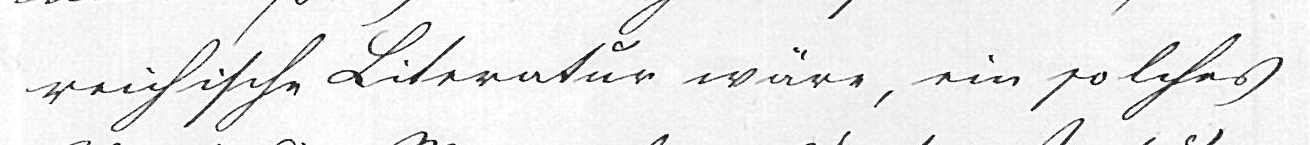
reichische Literatur wäre, ein solches
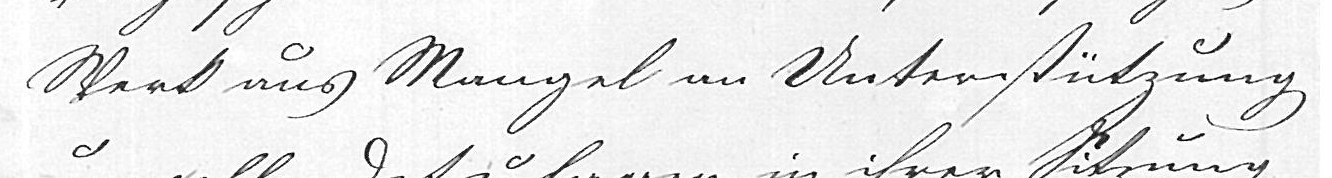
Werk aus Mangel an Unterstützung
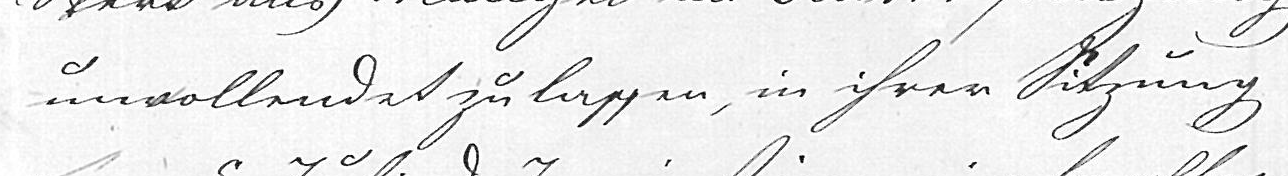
unvollendet zu lassen, in ihrer Sitzung
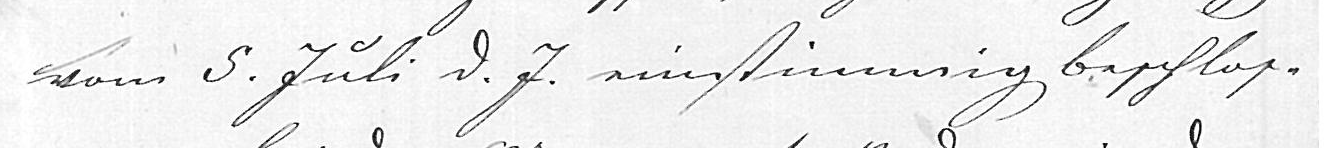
von 5. Juli d. J. einstimmig beschlos-
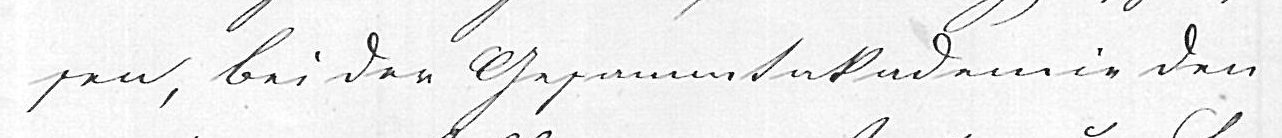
sen, bei der Gesammtakademie den
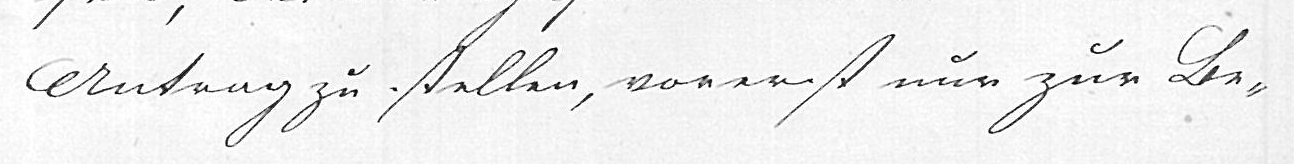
Antrag zu stellen, vorerst nur zur Be-
